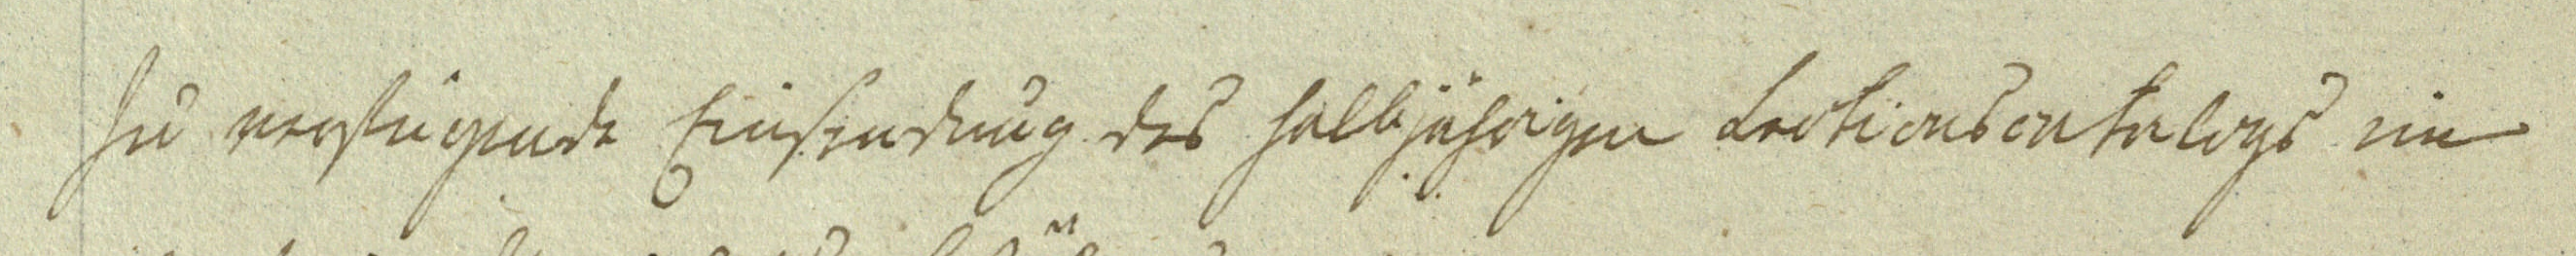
zu verfügende Einsendung des halbjährigen Lectionscatalogs im
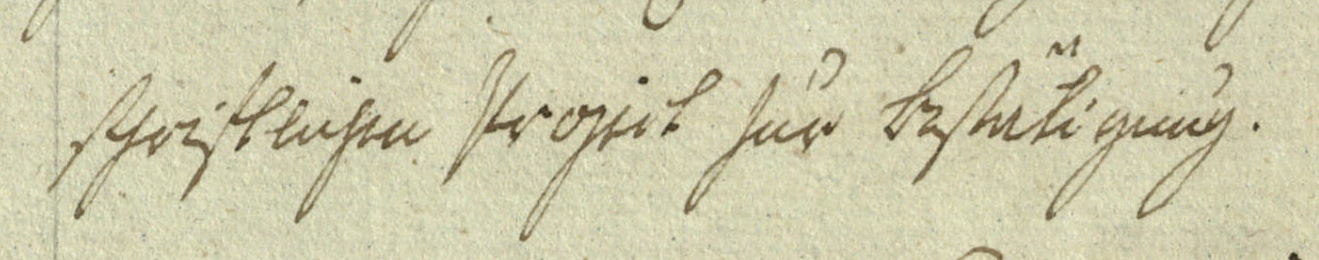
schriftlichen Project zur Bestätigung.
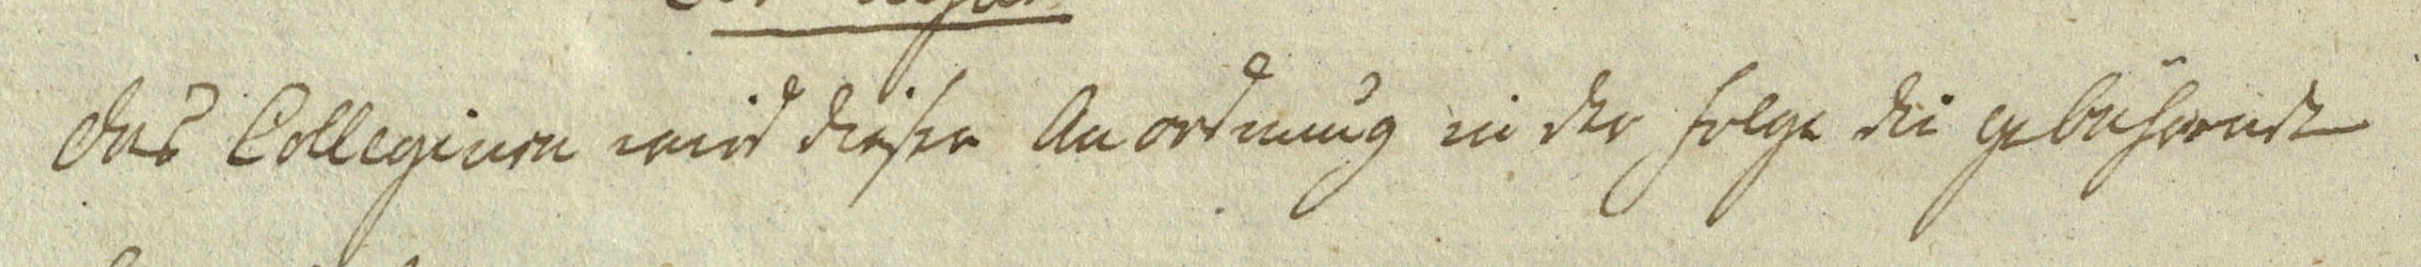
Das Collegium wird dieser Anordnung in der Folge die gebührende
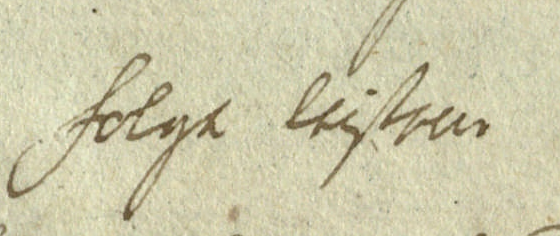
Folge leisten.
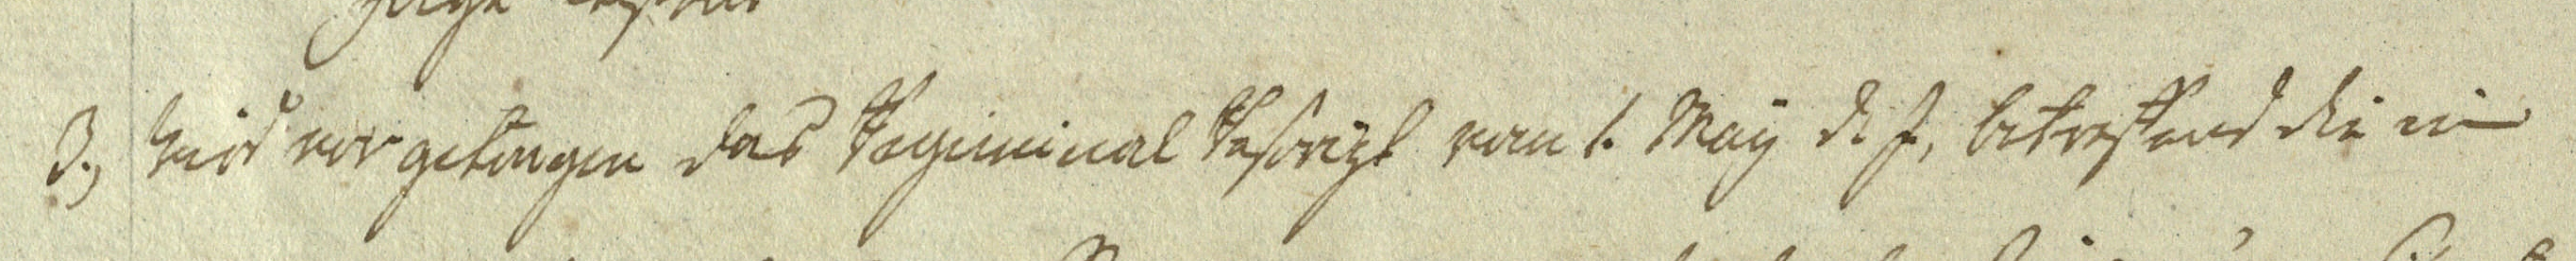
3., Wird vorgetragen das Regiminal Rescript vom 1. Maÿ d. J, betreffend die im
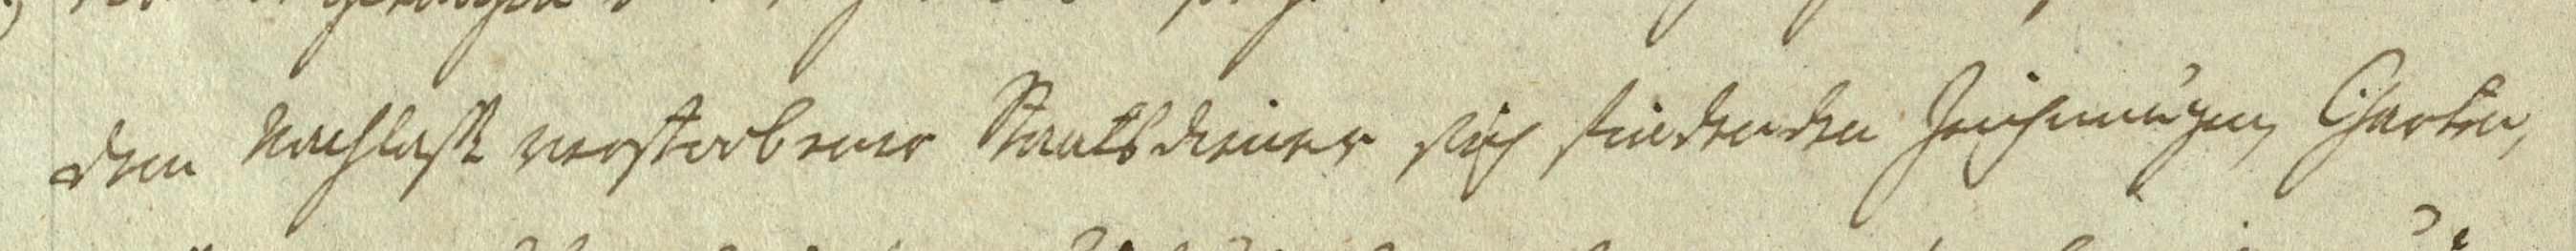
dem Nachlasse verstorbener Staatsdiener sich findenden Zeichnungen, Charten,
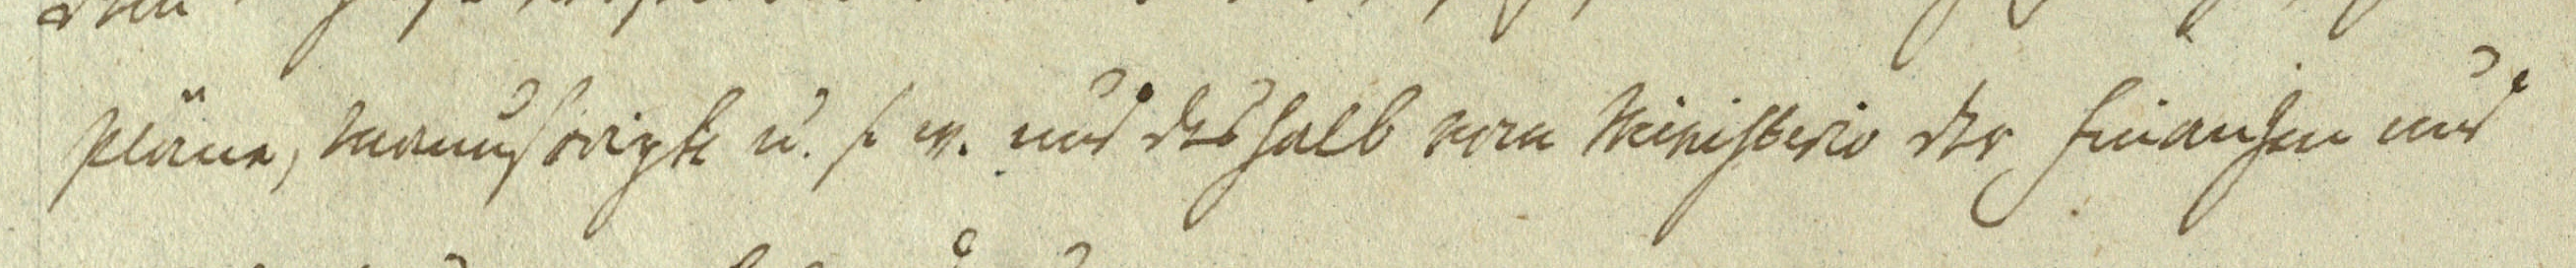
Pläne, Manuscripte u.s.w. und deshalb vom Ministerio der Finanzen und
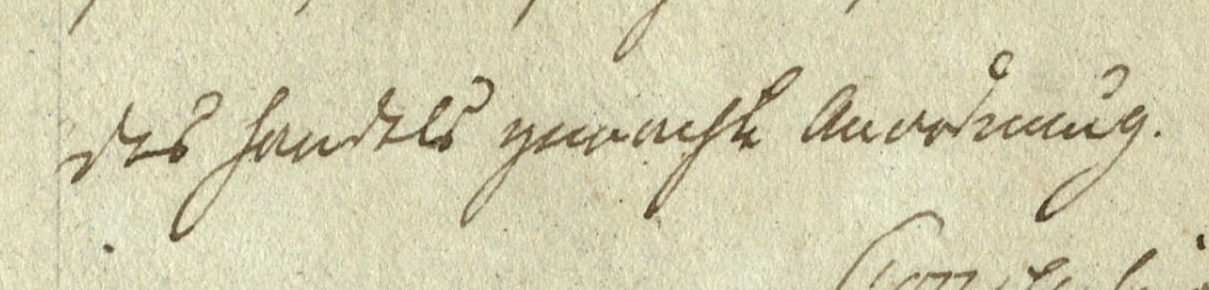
des handels gemachte Anordnung.
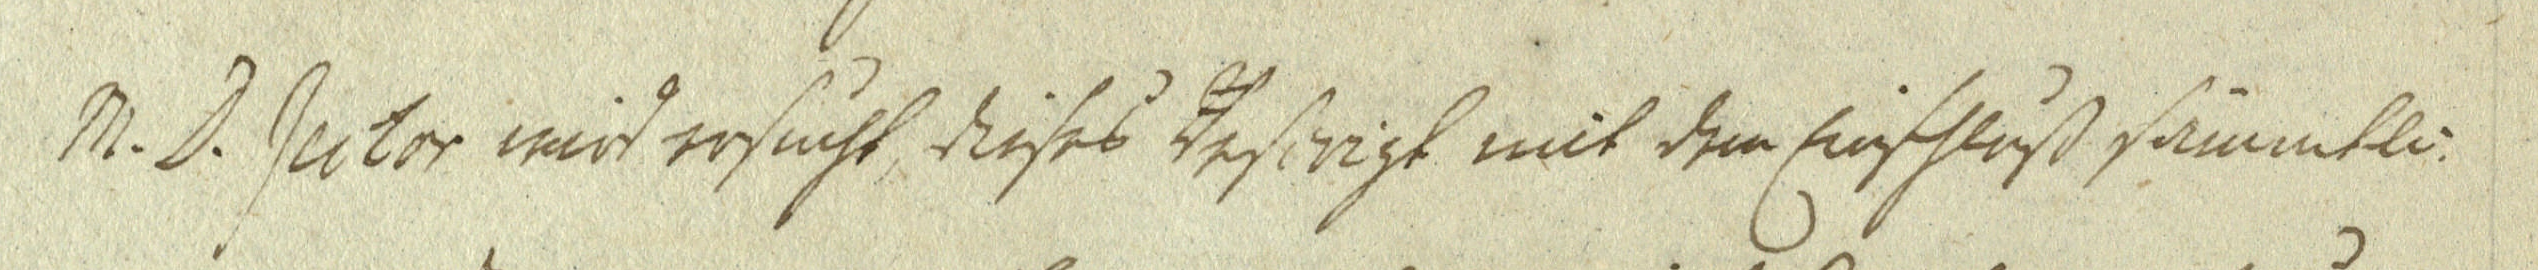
M. D. Rector wird ersucht, dieses Rescript mit dem Einschluß sämmtli¬
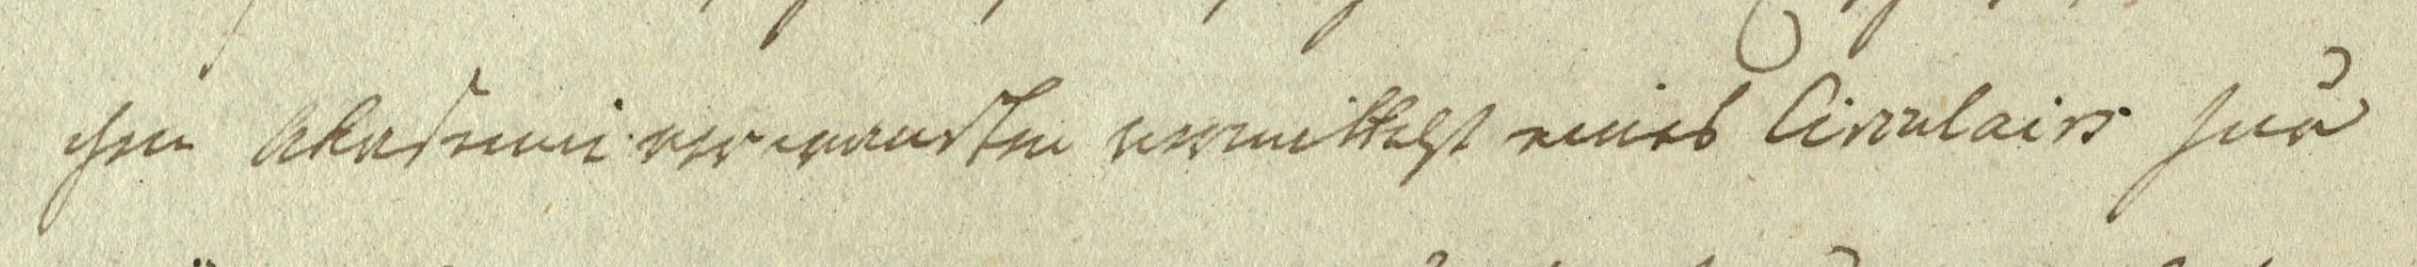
chen Akademieverwandten vermittelst eines Circulairs zur
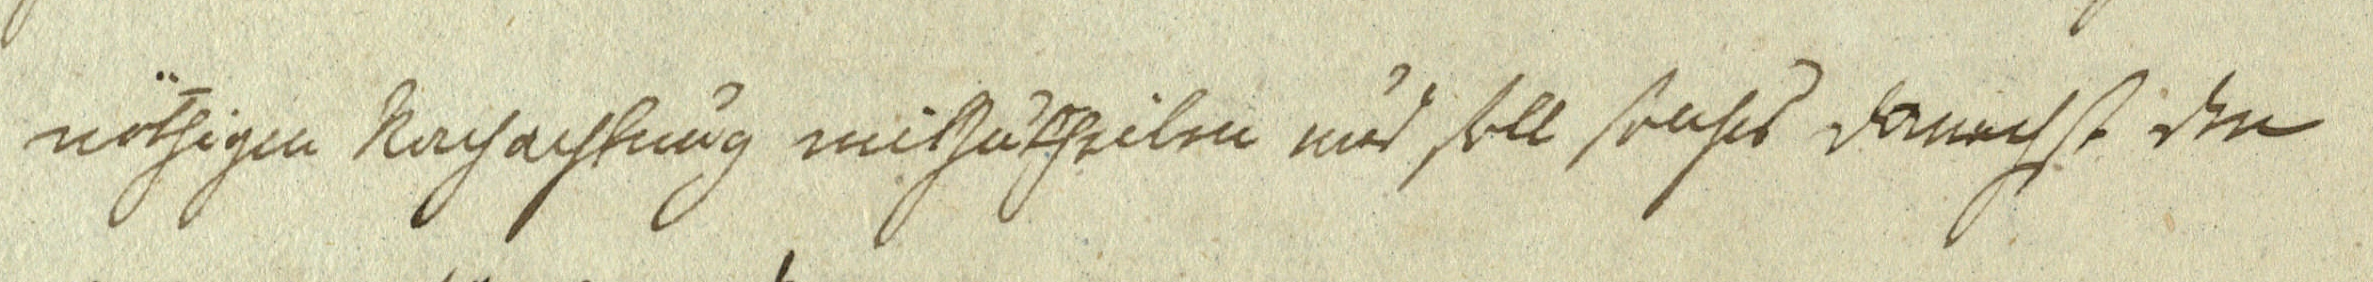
nöthigen Nachachtung mitzutheilen und soll solches danechst den
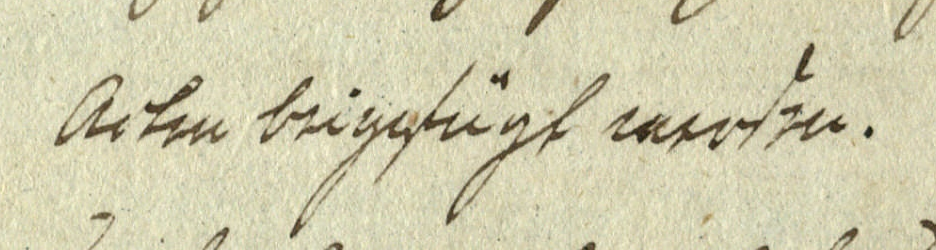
Acten beigefügt werden.
